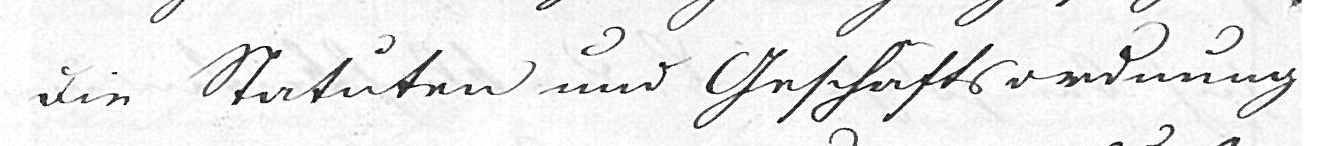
die Statuten und Geschäftsordnung
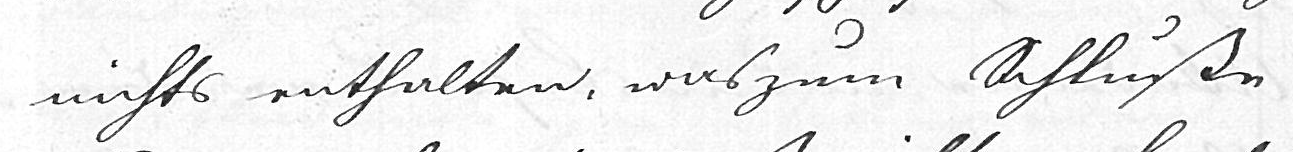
nichts enthalten, was zum Schluße
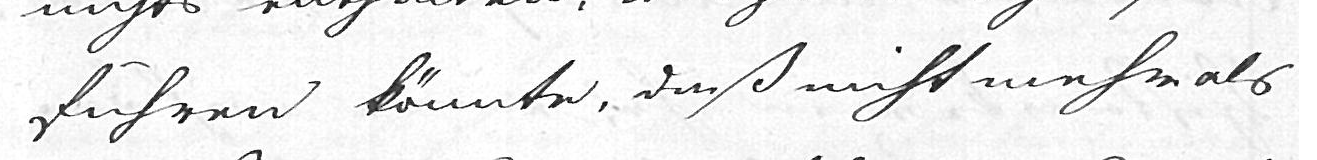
führen könnte, daß nicht mehr als
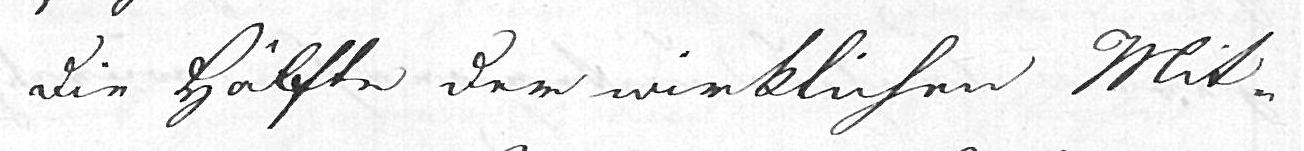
die Hälfte der wirklichen Mit-
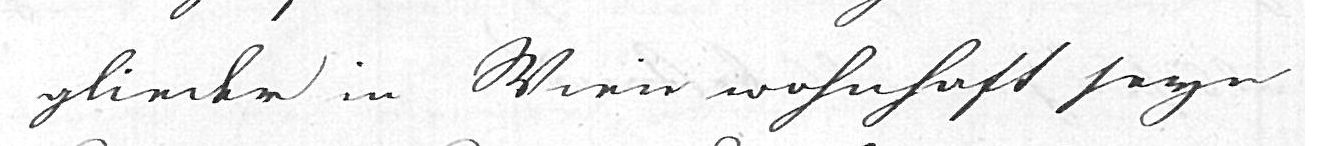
glieder in Wien wohnhaft seyn
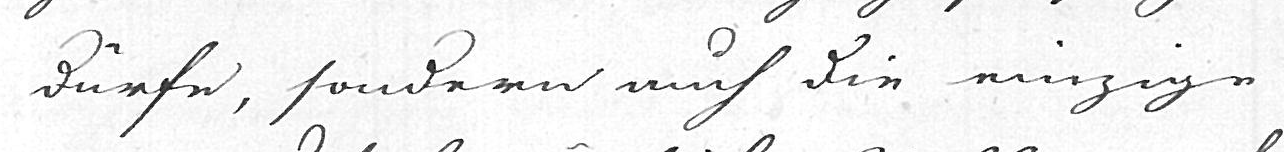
dürfe, sondern auch die einzige
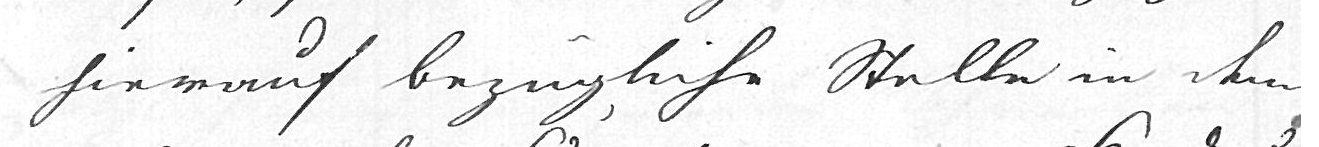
hierauf bezügliche Stelle in dem
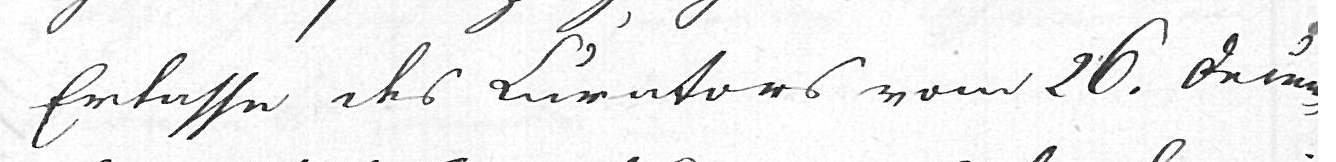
Erlasse des Curators vom 26. Decem-
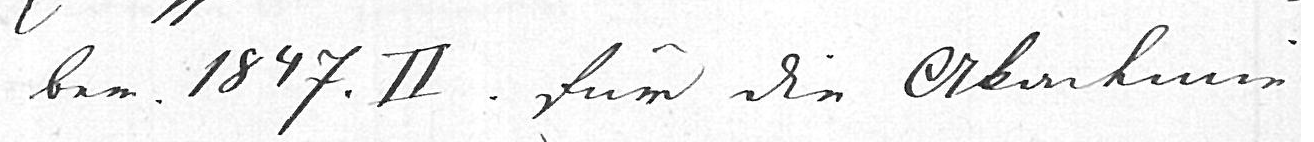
ber 1847.II. für die Akademie
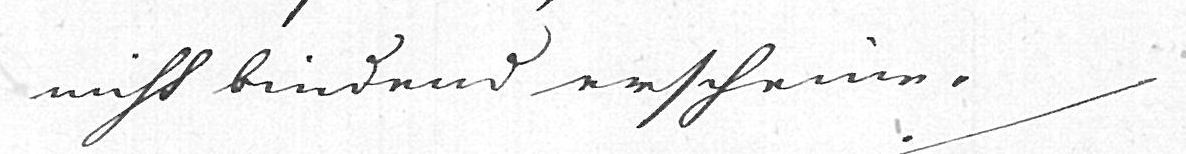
nicht bindend erscheine.
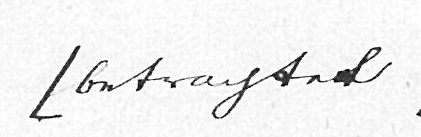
betrachtet
